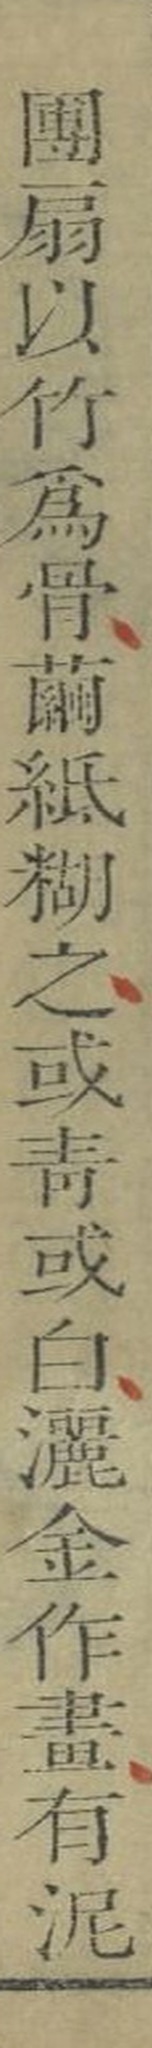団扇以竹為骨繭紙糊之或青或白灑金作画有泥
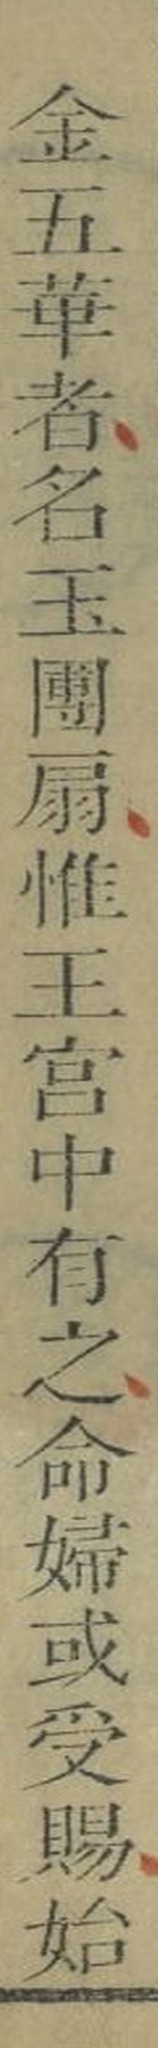金五華者名玉団扇惟王宮中有之命婦或受賜始
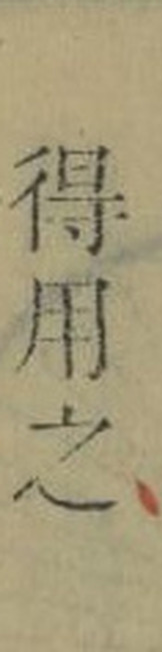得用之
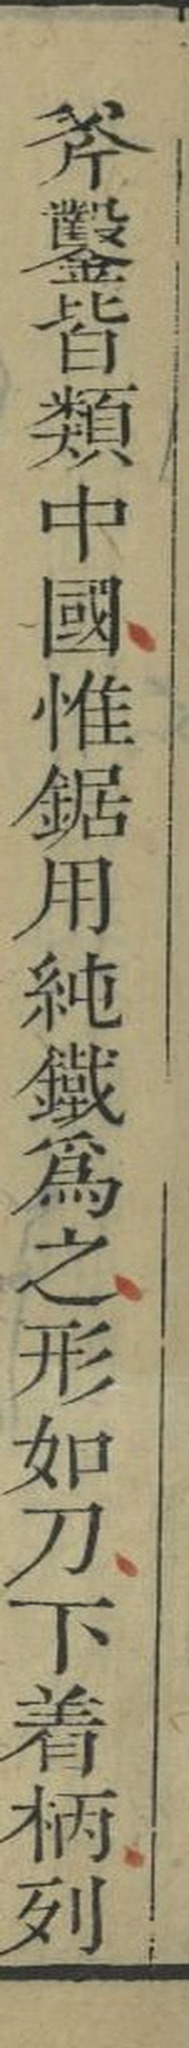斧鑿皆類中国惟鋸用純鉄為之形如刀下着柄列
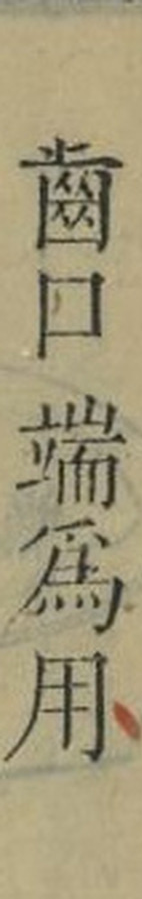歯口端為用

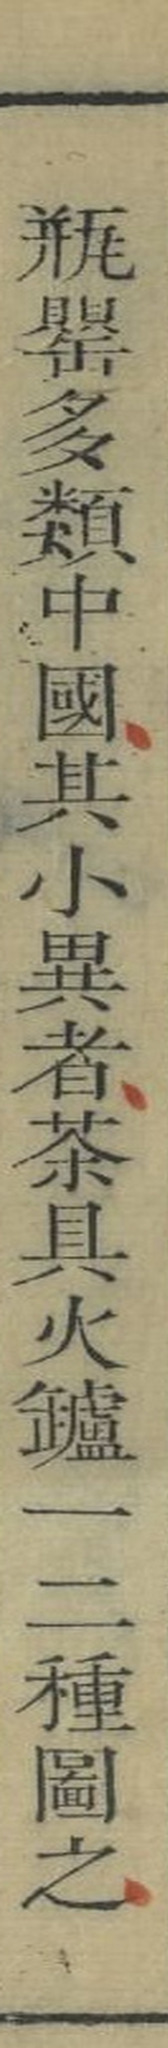瓶罌多類中国其小異者茶具火罏一二種図之
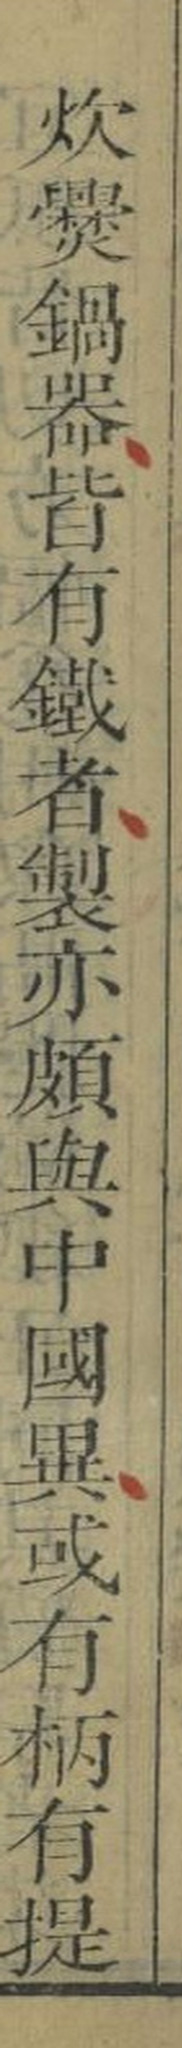炊爨鍋器皆有鉄者製亦頗与中国異或有柄有提
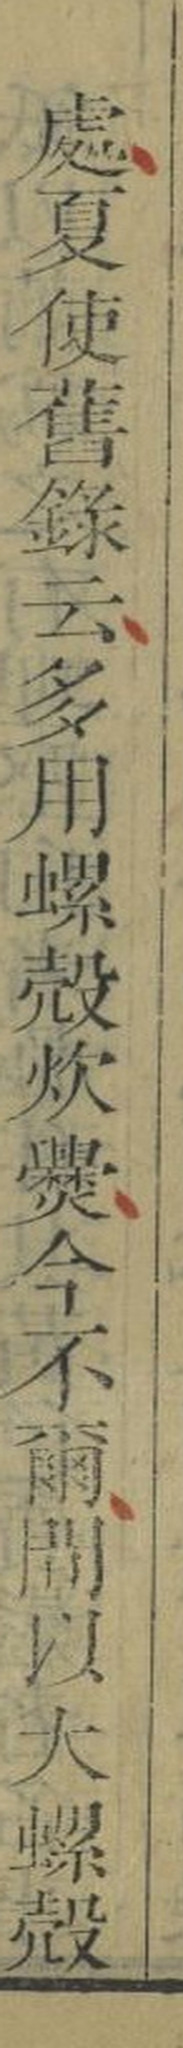処夏使旧録云多用螺殻炊爨今不爾間以大螺殻
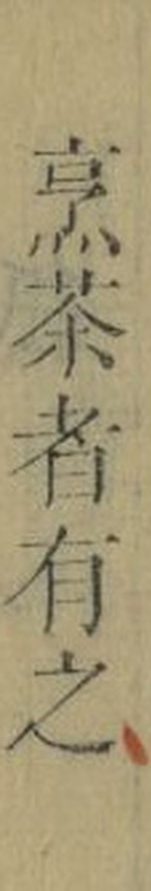烹茶者有之

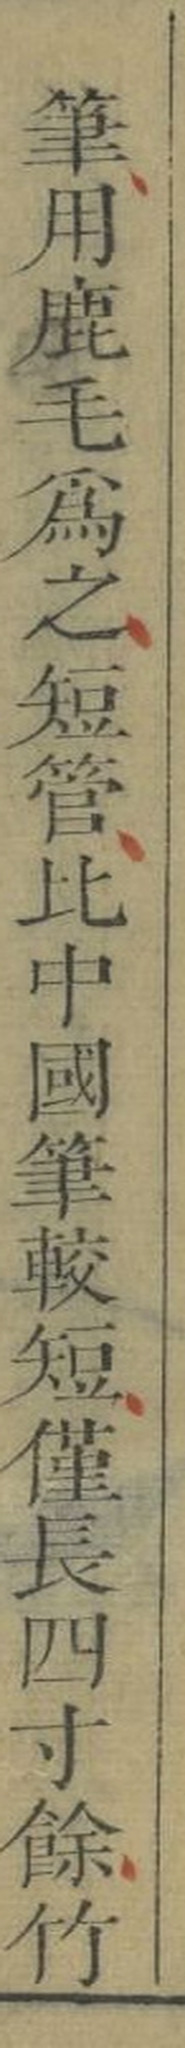筆用鹿毛為之短管比中国筆較短僅長四寸余竹
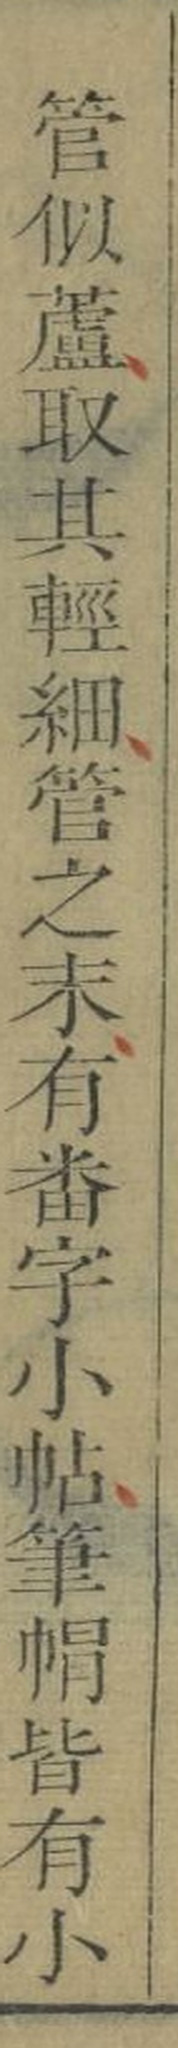管似蘆取其軽細管之末有番字小帖筆帽皆有小
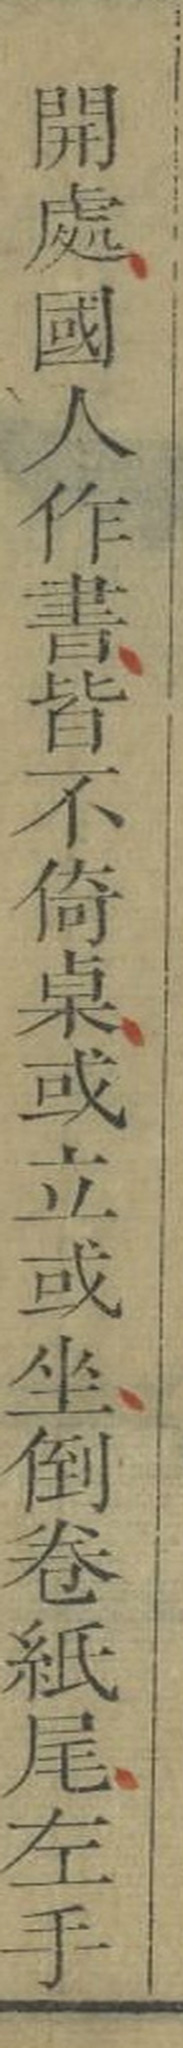開処国人作書皆不倚桌或立或坐倒巻紙尾左手
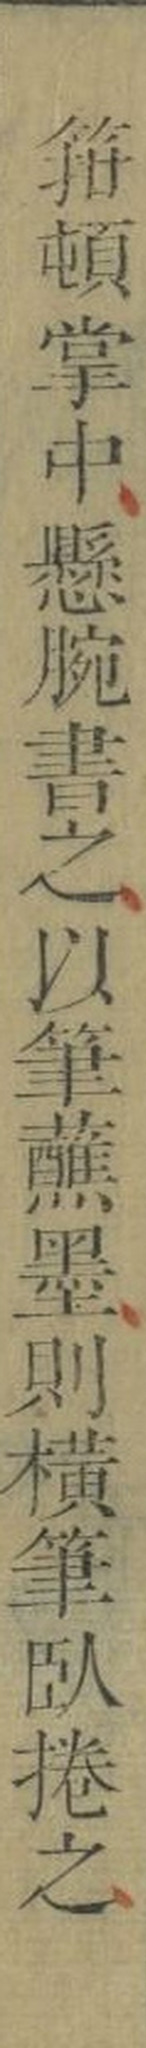箝頓掌中懸腕書之以筆蘸墨則横筆臥捲之
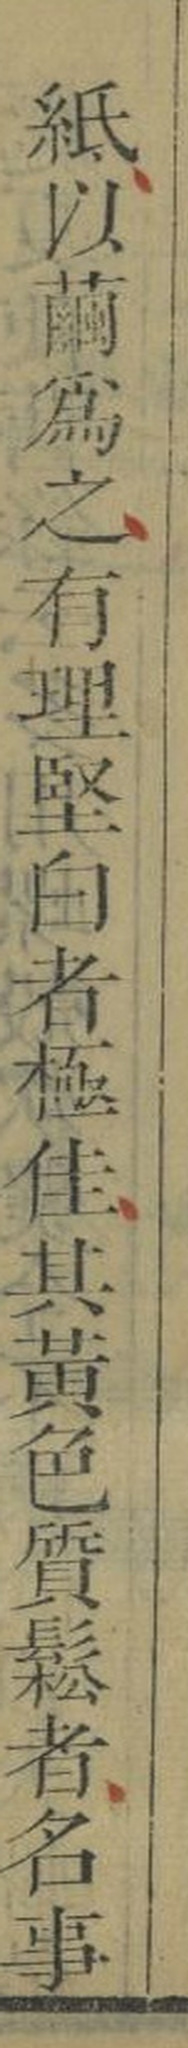紙以繭為之有理堅白者極佳其黄色質鬆者名事
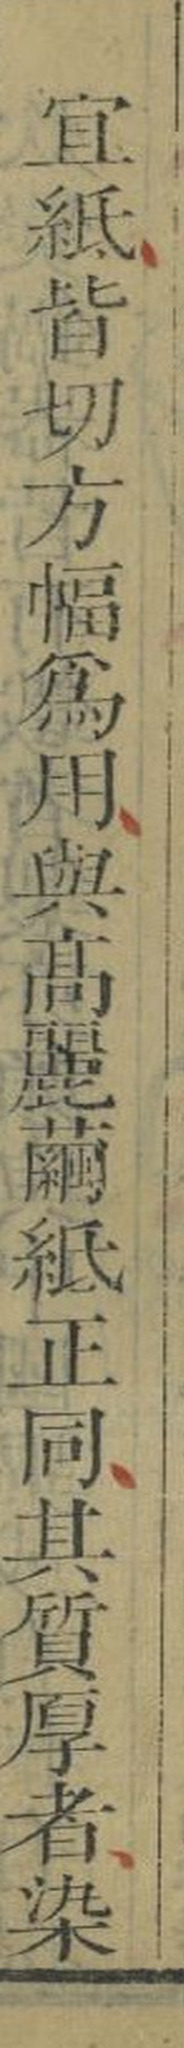宜紙皆切方幅為用与高麗繭紙正同其質厚者染
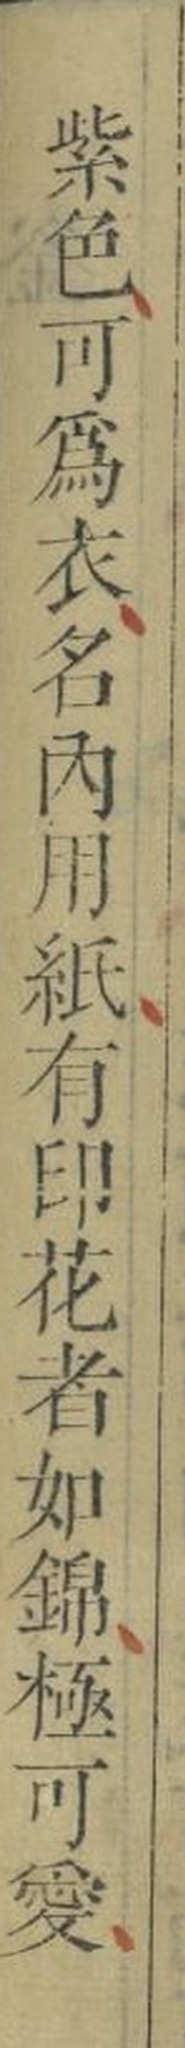紫色可為衣名内用紙有印花者如錦極可愛
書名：中山伝信録 巻六
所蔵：University of the Ryukyus Library
